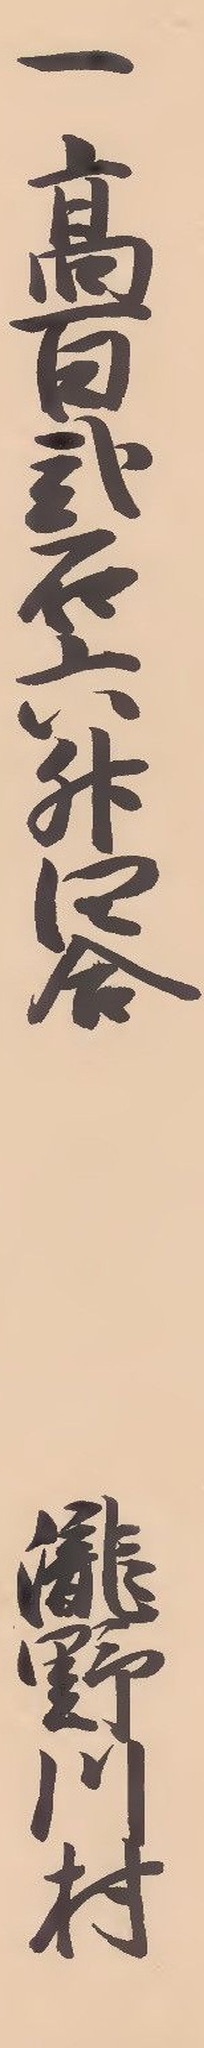一高百弐石六升四合滝野川村
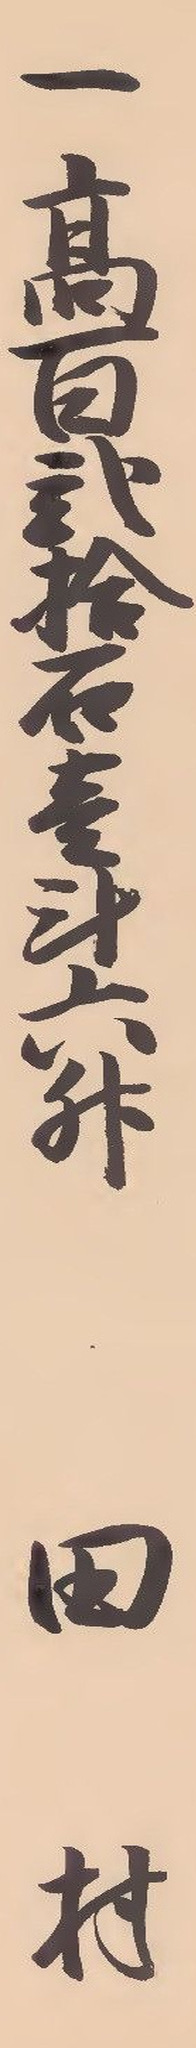一高百弐拾石壱斗六升田村
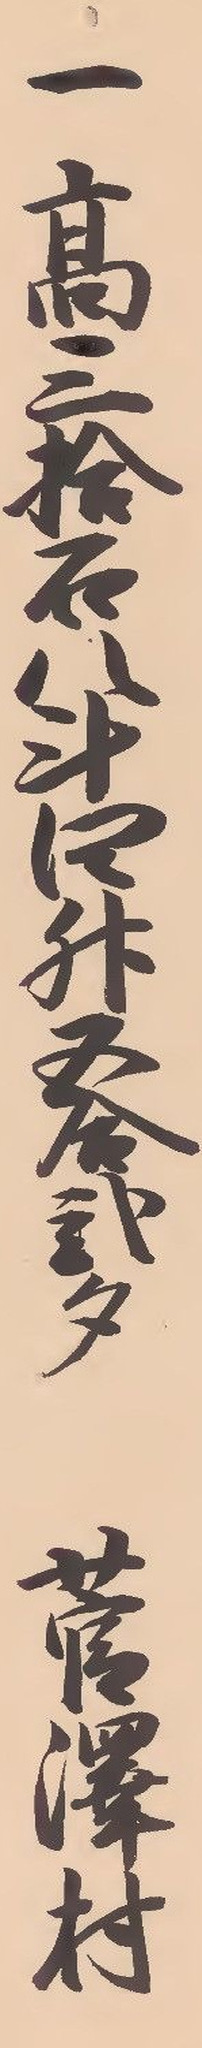一高三拾石八斗四升五合弐勺菅沢村
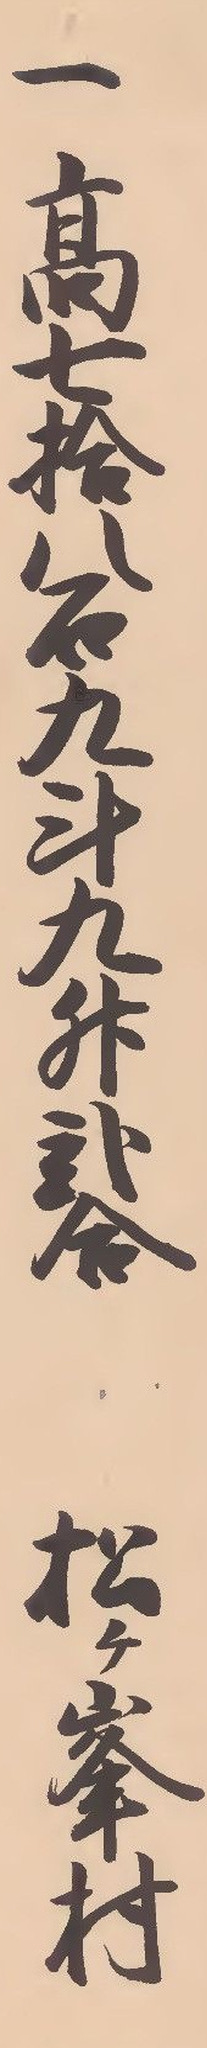一高七拾八石九斗九升弐合松ヶ峰村
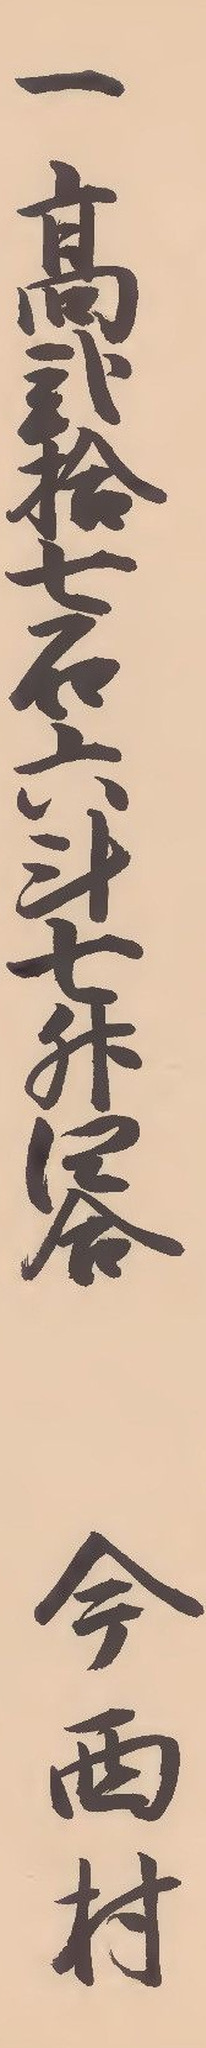一高弐拾七石六斗七升四合今西村
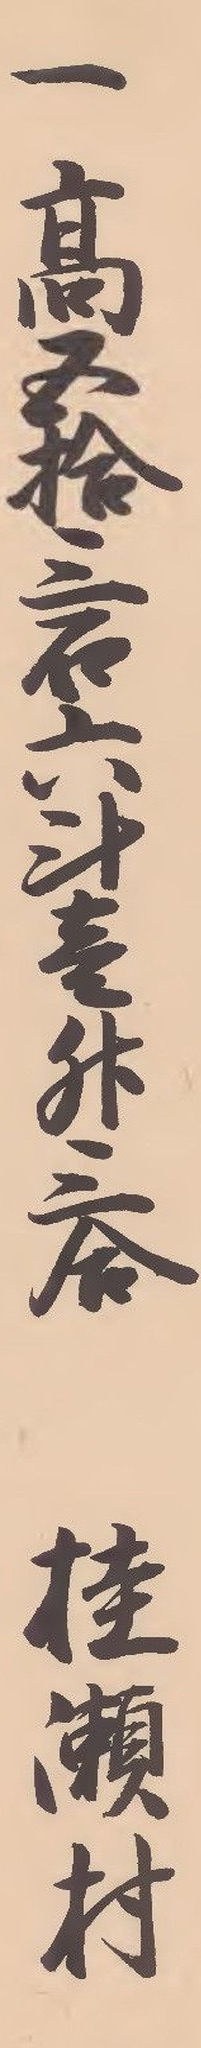一高五拾三石六斗壱升三合桂瀬村
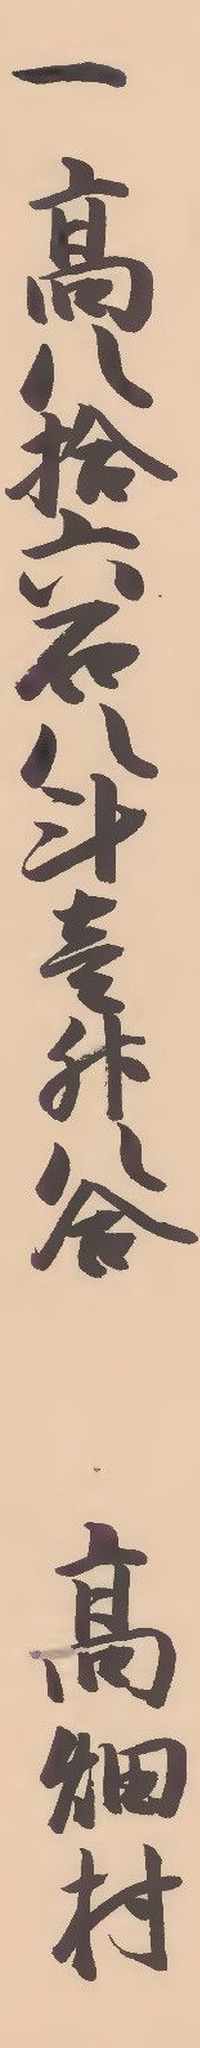一高八拾六石八斗壱升八合高畑村

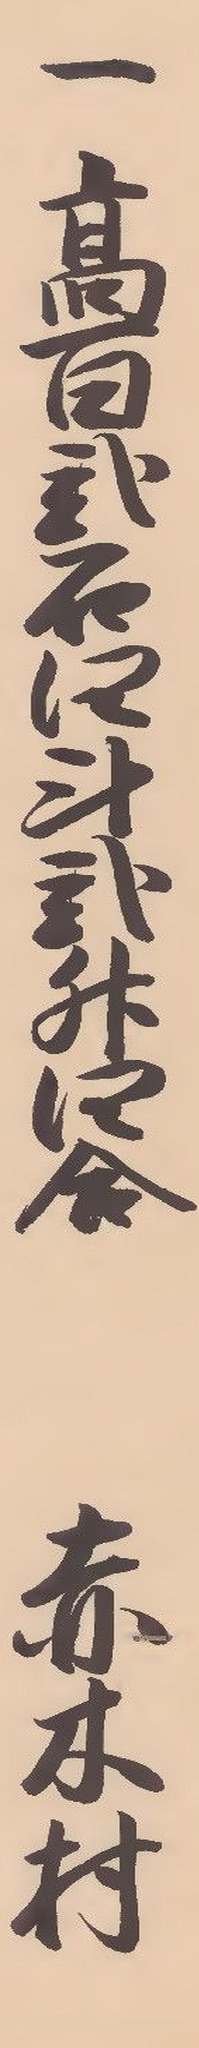一高百弐石四斗弐升四合赤木村
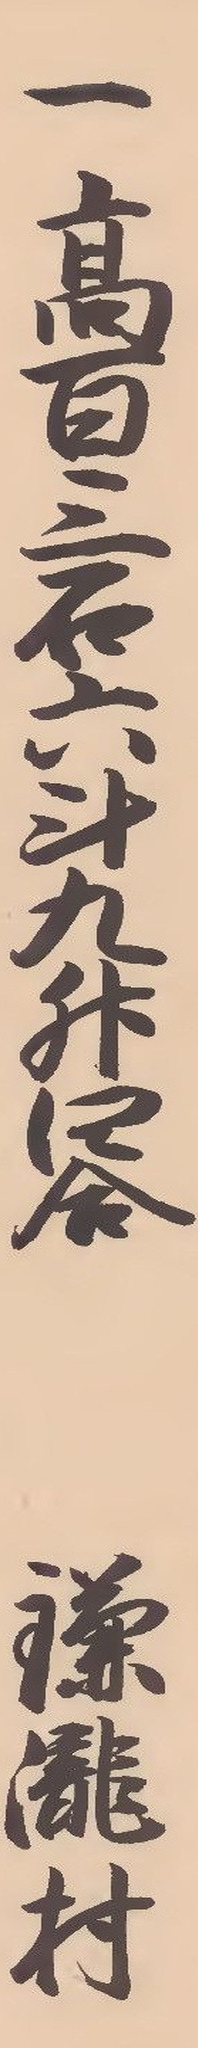一高百三石六斗九升四合鎌滝村
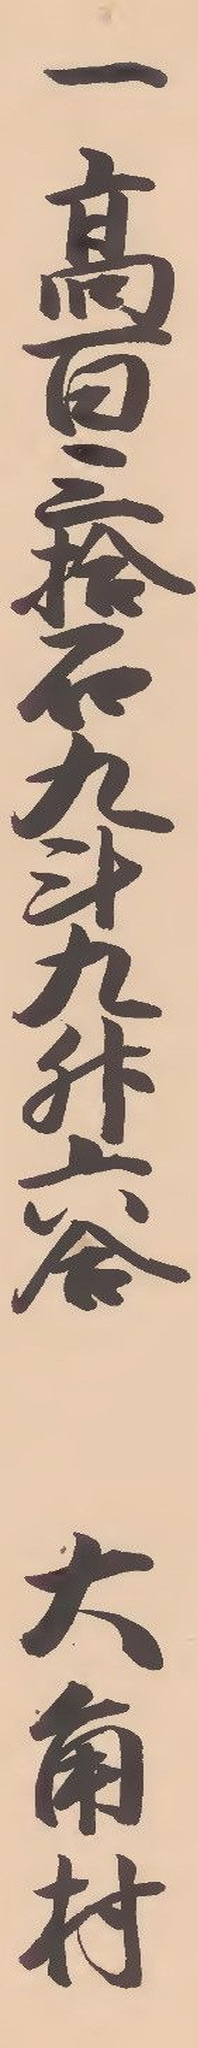一高百三拾石九斗九升六合大角村
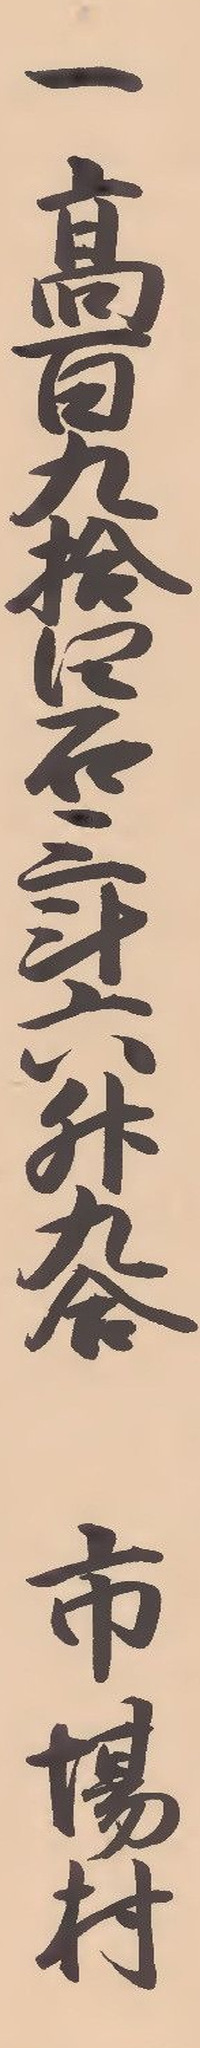一高百九拾四石三斗六升九合市場村
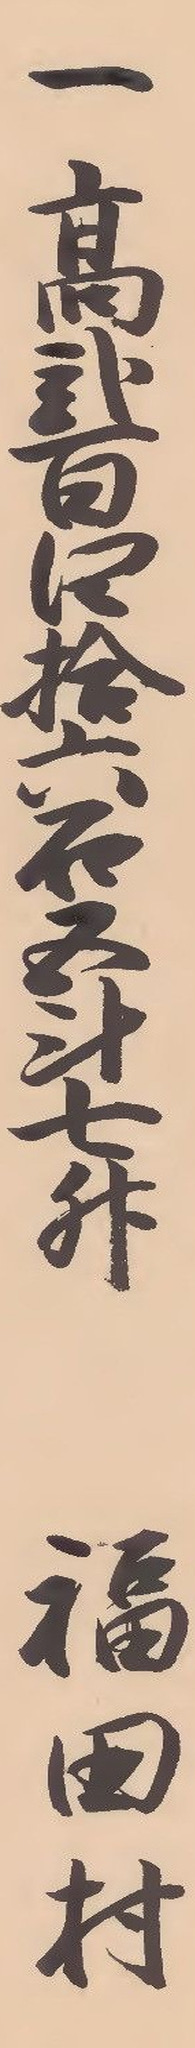一高弐百四拾六石五斗七升福田村
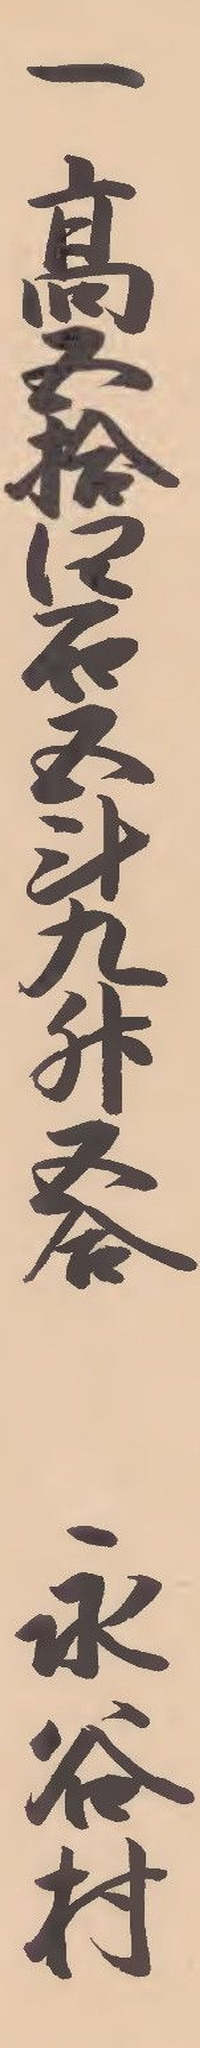一高五拾四石五斗九升五合永谷村
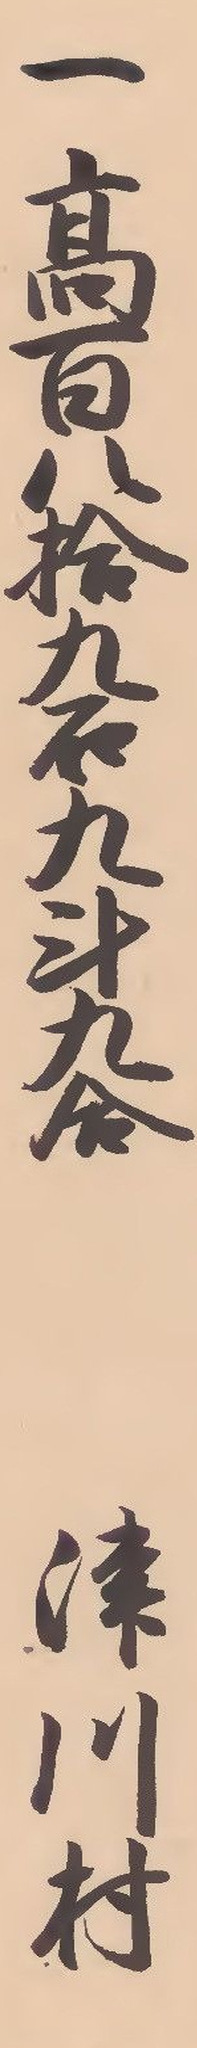一高百八拾九石九斗九合津川村

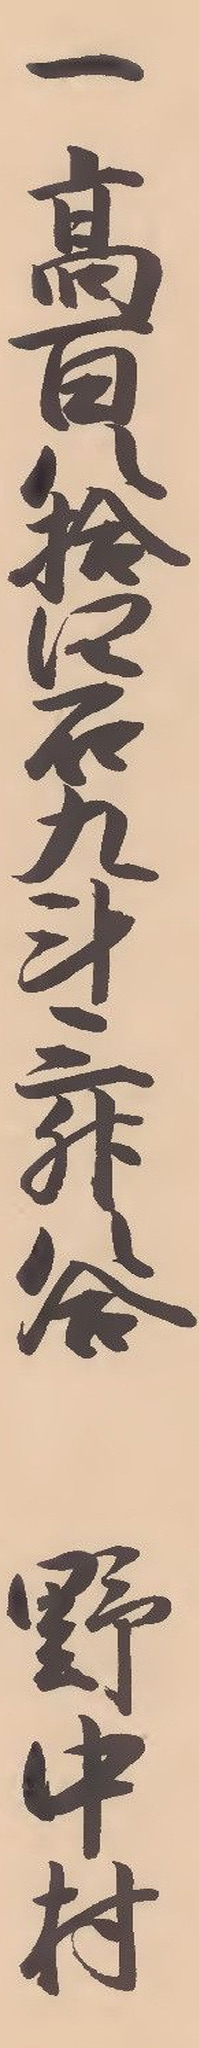一高百八拾四石九斗三升八合野中村
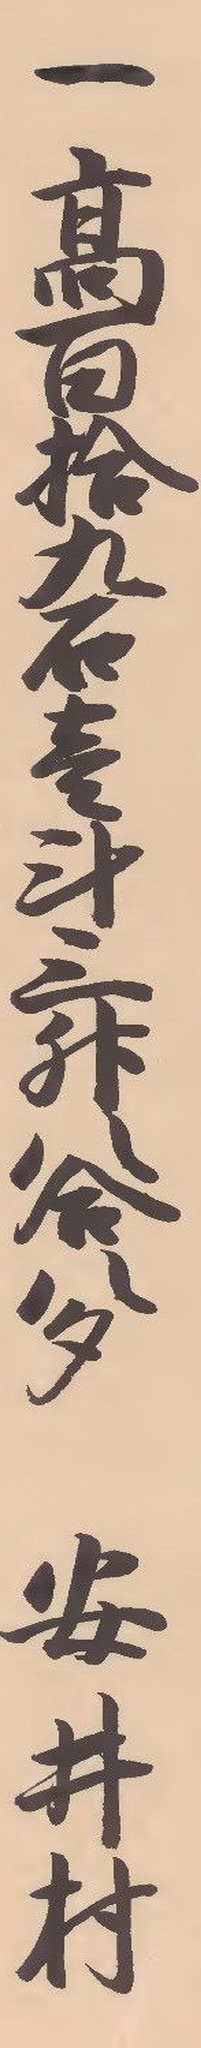一高百拾九石壱斗三升八合八勺安井村
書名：紀伊国郷帳
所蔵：国立公文書館 National Archives of Japan
